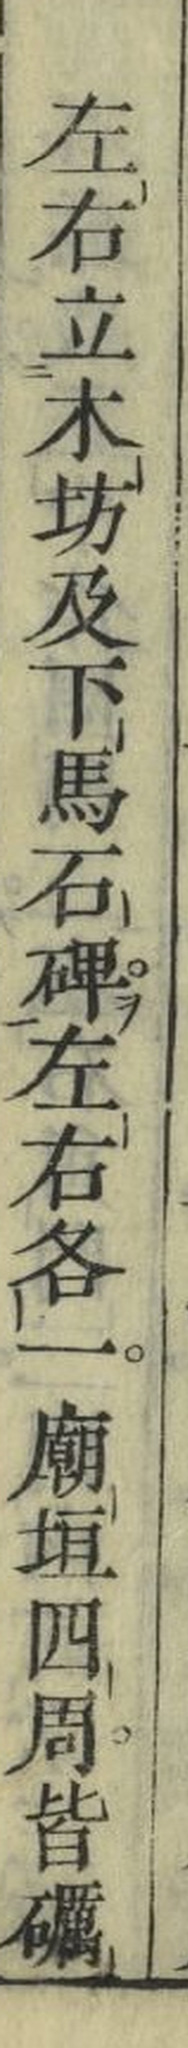左-右立木-坊及下-馬石-碑。左-右各-一。廟-垣四-周。皆礪-

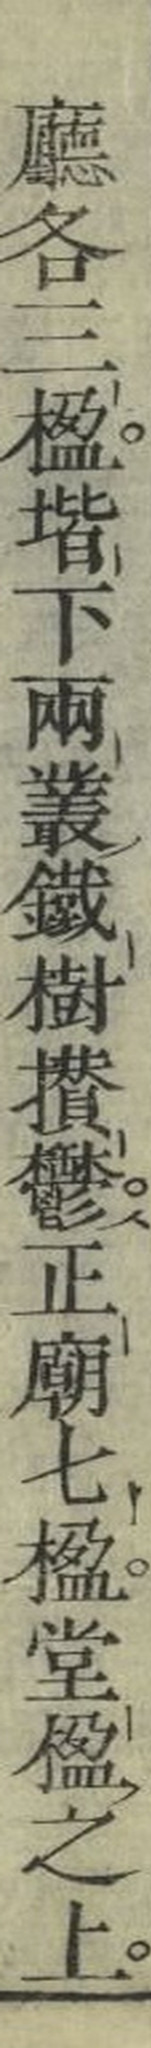庁各三-楹。堦-下両-叢鉄-樹攢-鬱。正-廟七-楹。堂-楹之上。

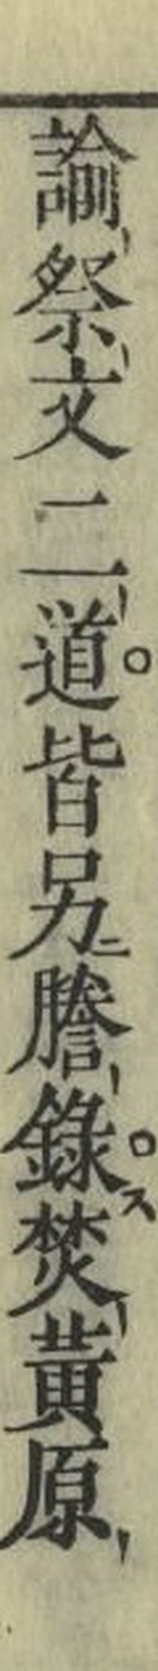諭-祭-文二-道。皆另謄-録。焚-黄原-

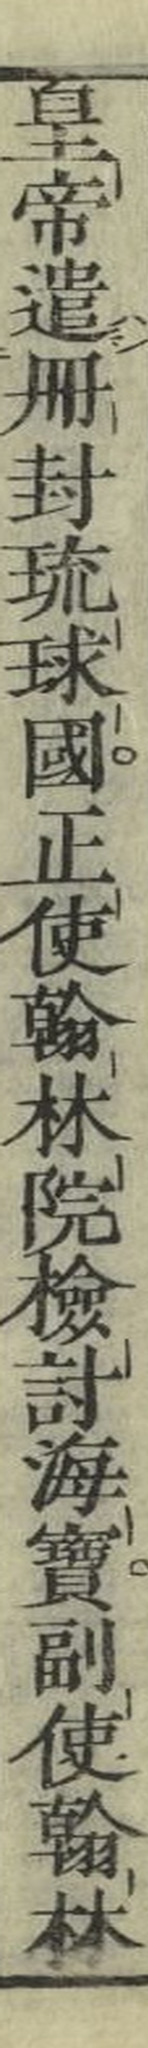皇-帝遣冊-封琉-球-国。正-使翰-林-院検-討海-宝。副-使翰-林
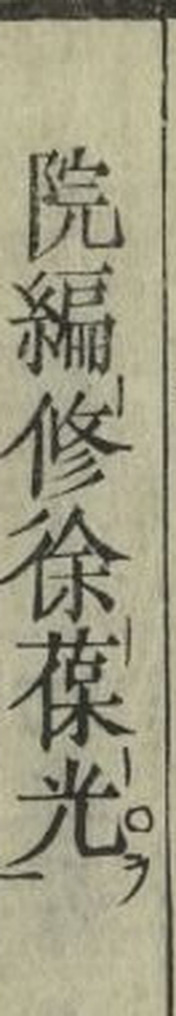院編-修徐-葆-光。
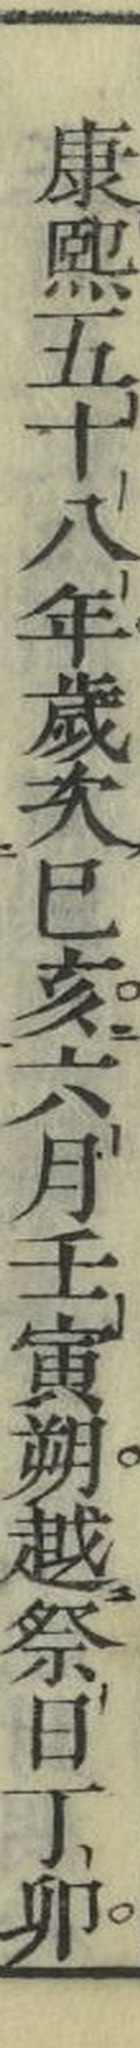康-熙五-十-八-年。歳次巳亥。六-月壬-寅朔。越祭-日丁-卯。
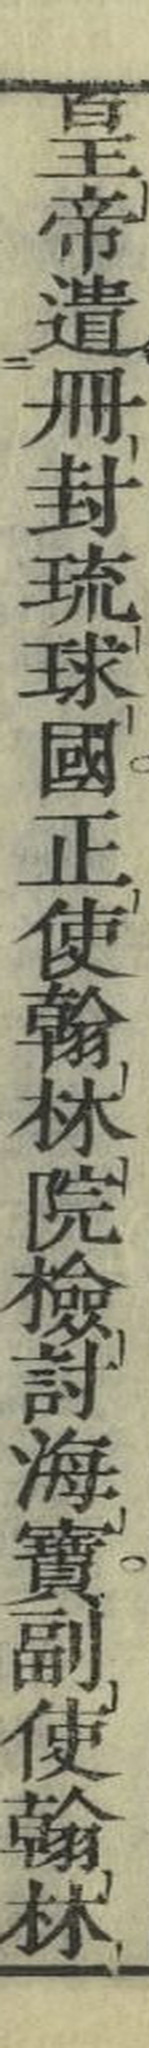皇-帝遣冊-封琉-球-国。正-使翰-林-院検-討海-宝。副-使翰-林

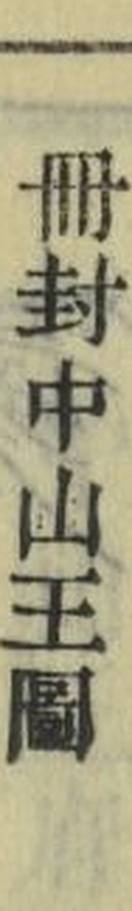冊封中山王図

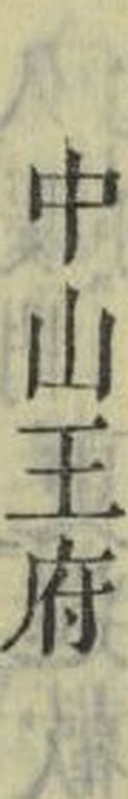中山王府

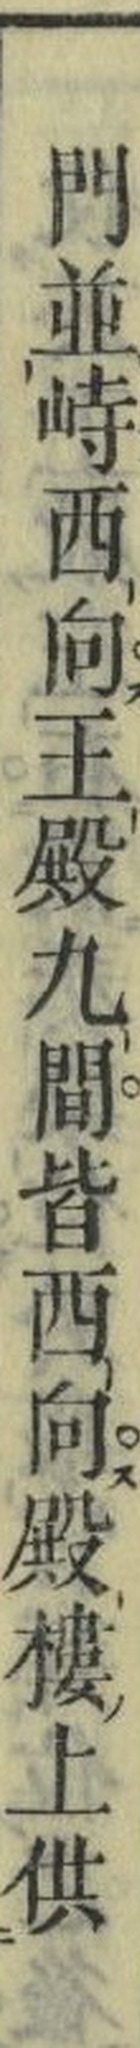門並-峙西-向。王-殿九-間。皆西-向。殿-楼上供

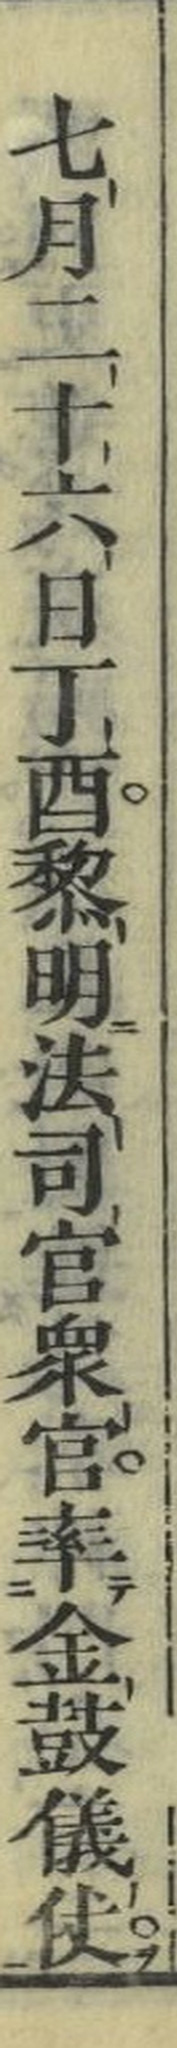七-月二-十-六-日丁-酉。黎-明法-司-官衆-官。率金-鼓儀-仗。

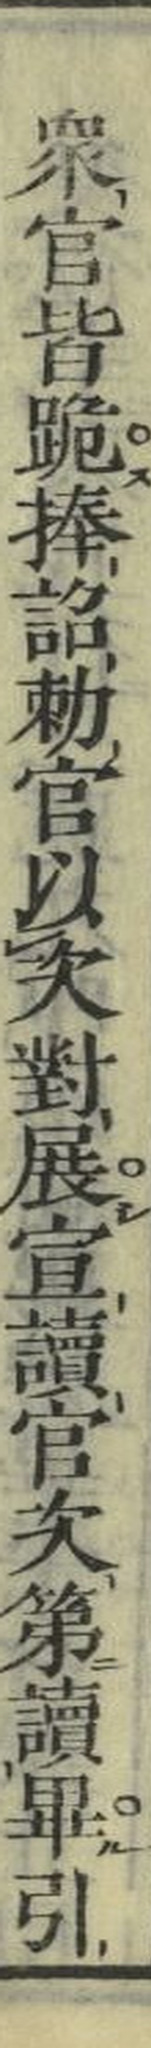衆-官皆跪。捧-詔-勅-官以次対-展。宣-読-官次-第読-畢。引-

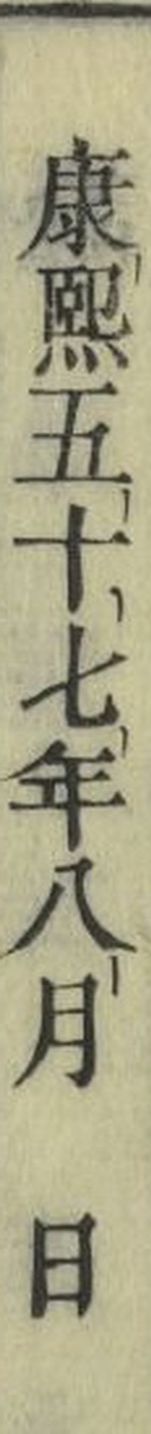康-熙五-十-七-年八-月日

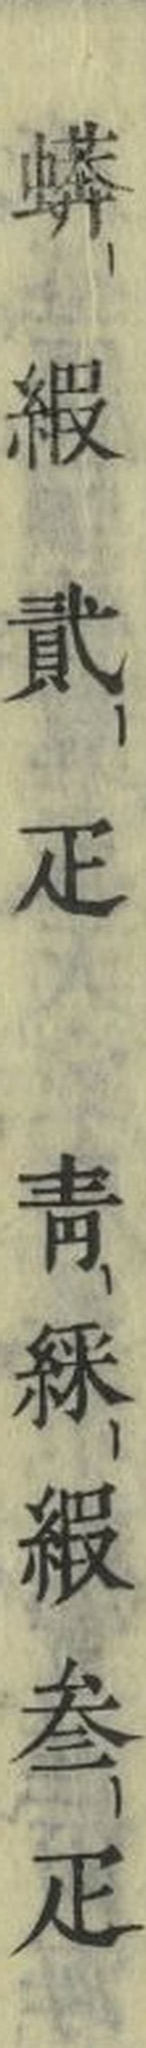蠎-縀弐-疋青-綵-縀参-疋
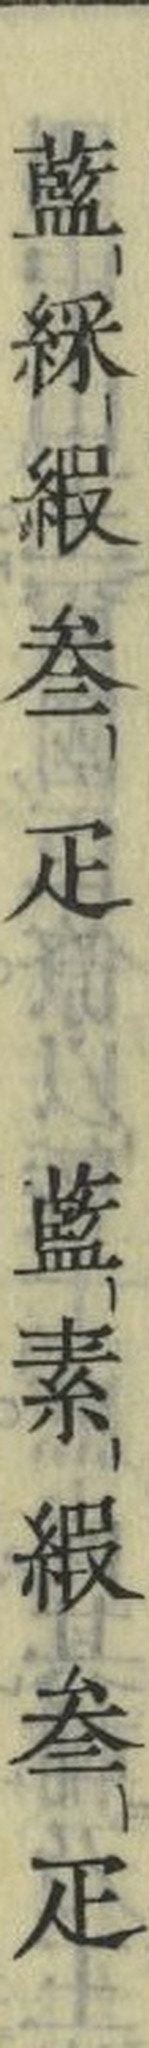藍-綵-縀参-疋藍-素-縀参-疋
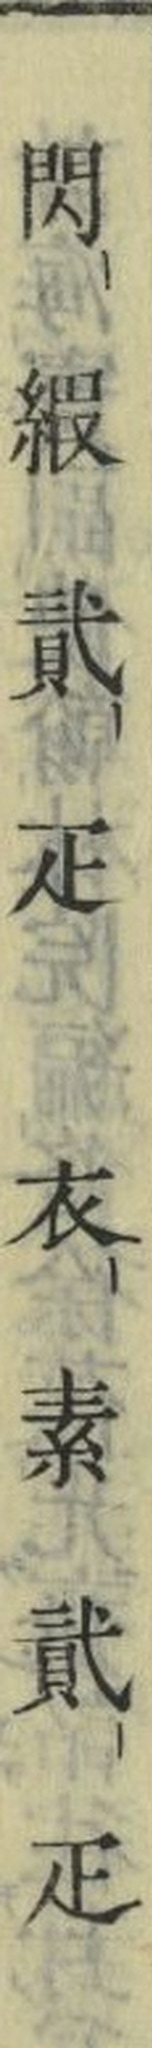閃-縀弐-疋衣-素弐-疋
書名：中山伝信録 巻二
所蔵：University of the Ryukyus Library
